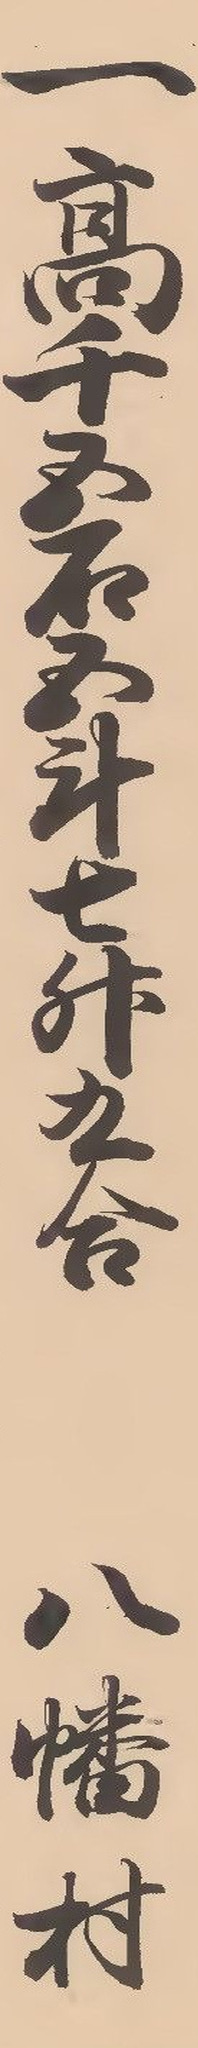一高千五石五斗七升九合八幡村
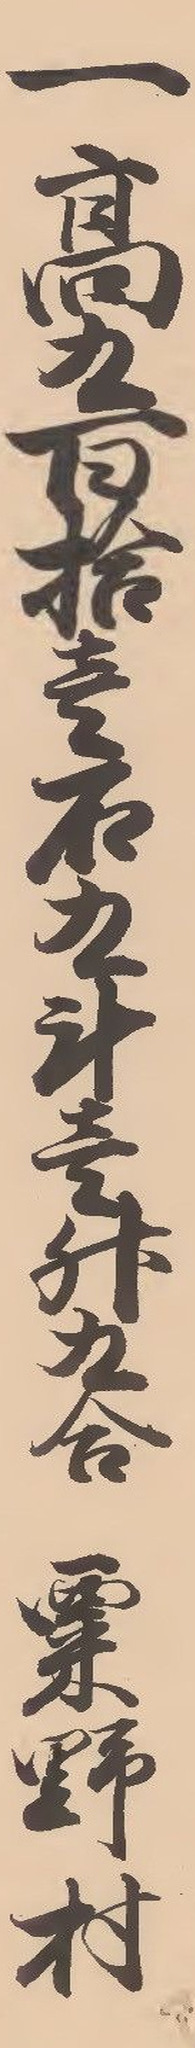一高九百拾壱石九斗壱升九合粟野村
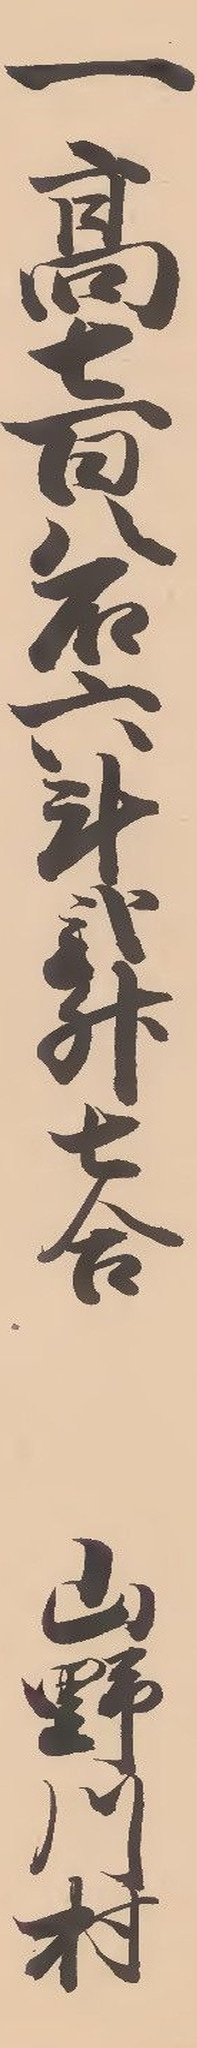一高七百八石六斗弐升七合山野川村
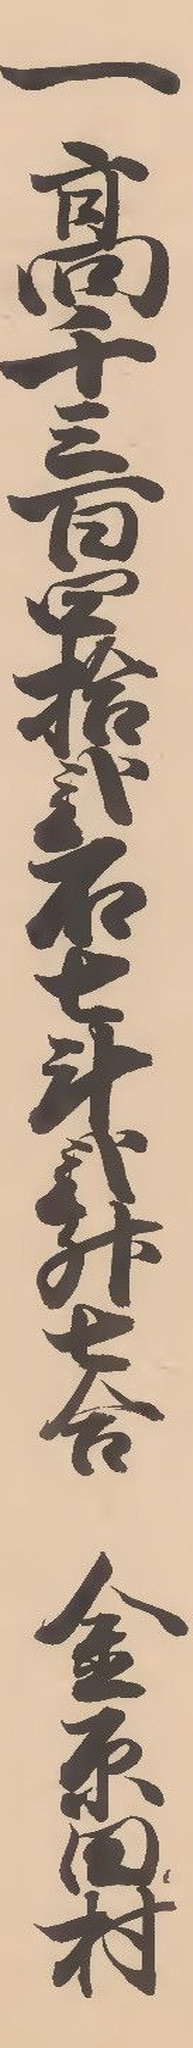一高千三百四拾弐石七斗弐升七合金原田村
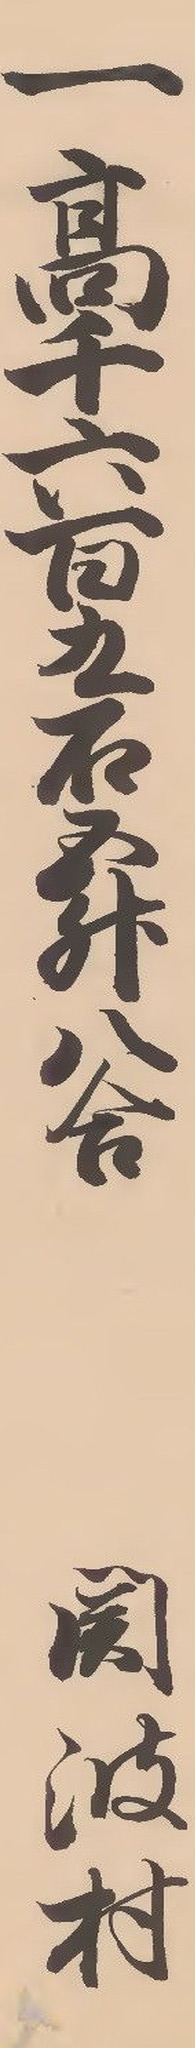一高千六百九石五升八合関波村
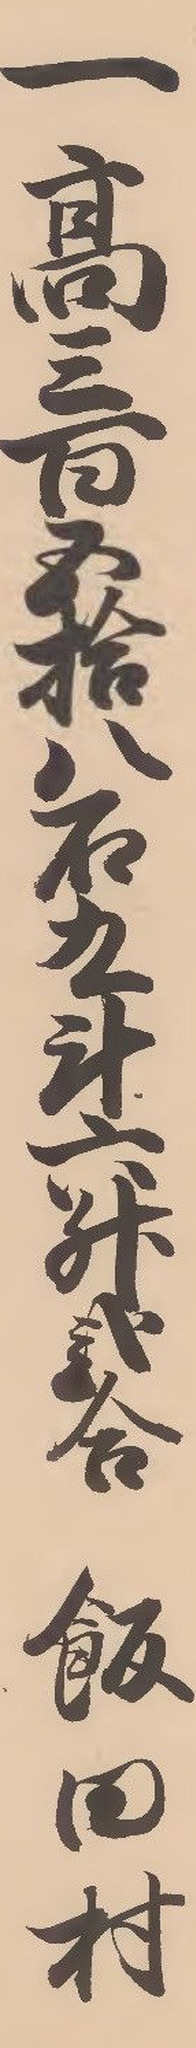一高三百五拾八石九斗六升弐合飯田村
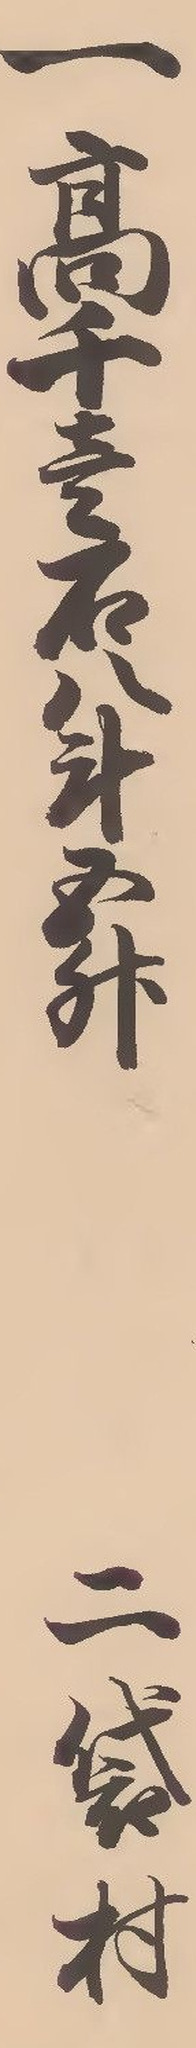一高千壱石八斗五升二袋村

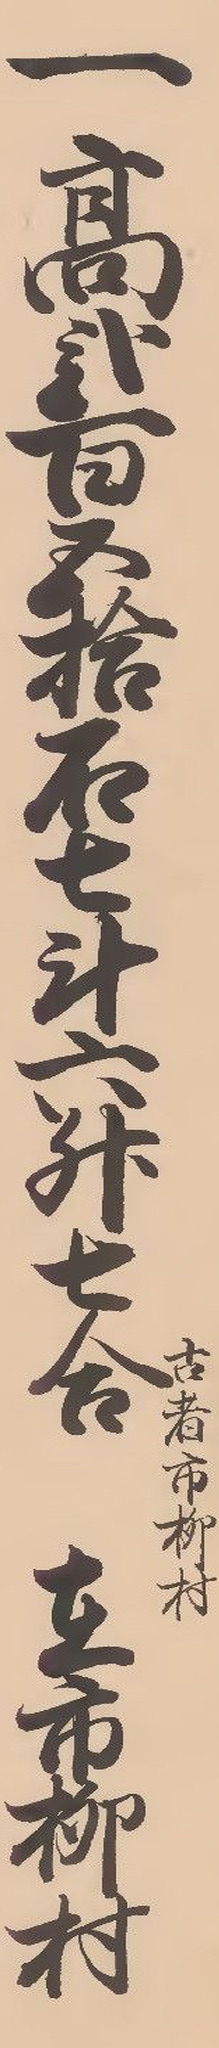一高弐百五拾石七斗六升七合在市柳村
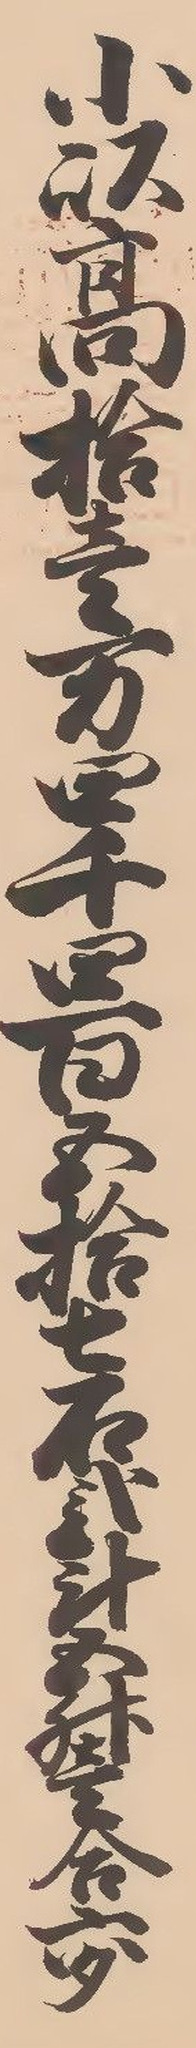小以高拾壱万四千四百五拾七石弐斗五升壱合六勺
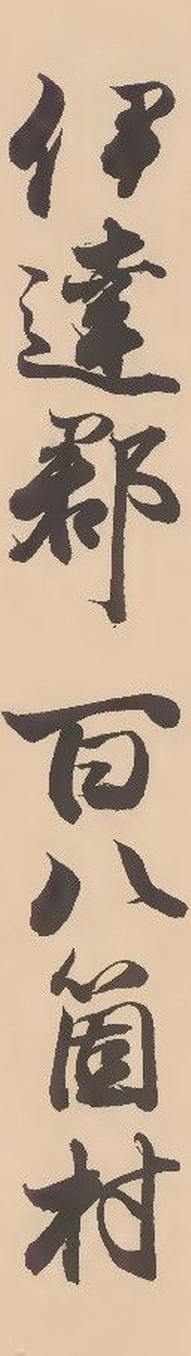伊達郡百八箇村
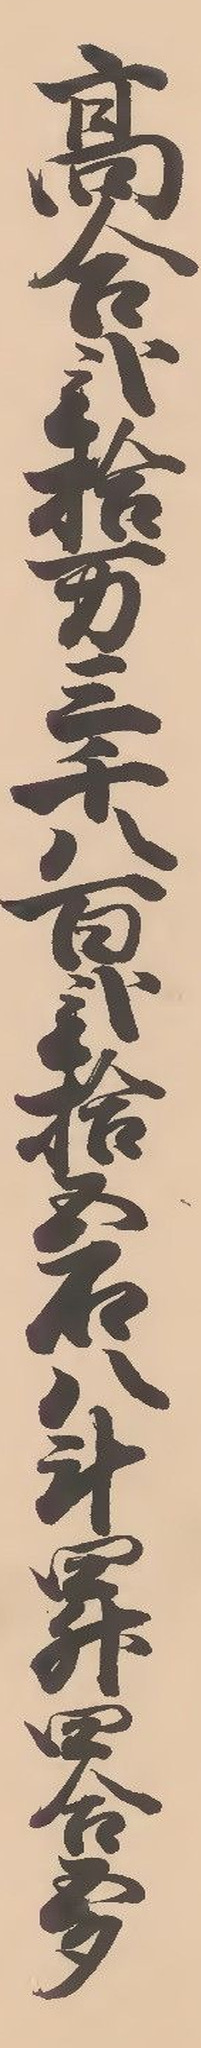高合弐拾万三千八百弐拾五石八斗四升四合五勺
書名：陸奥国郷帳　４
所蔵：国立公文書館 National Archives of Japan
